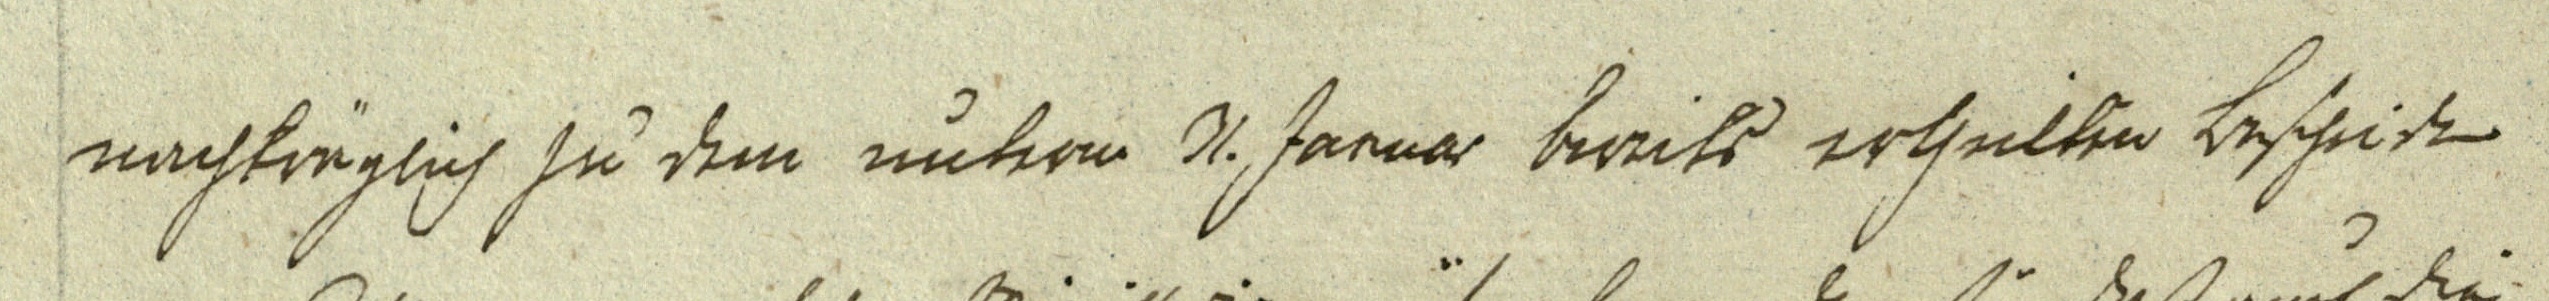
nachträglich zu dem unterm 31. Januar bereits ertheilten Bescheide
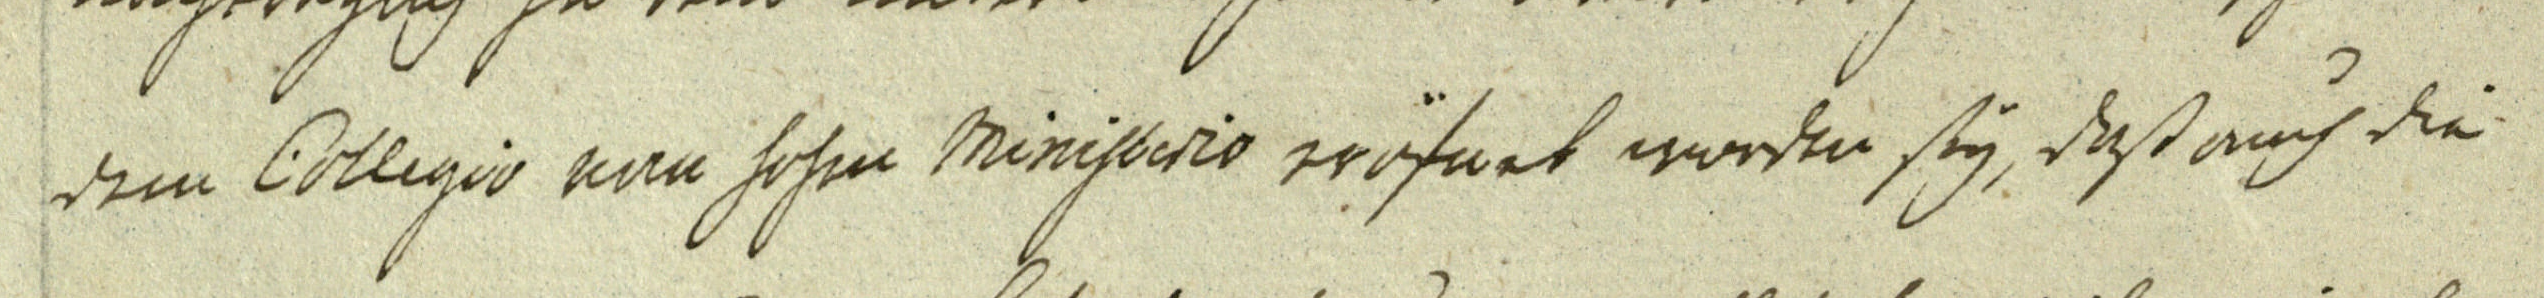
dem Collegio vom hohen Ministerio eröfnet worden seÿ, daß auch die
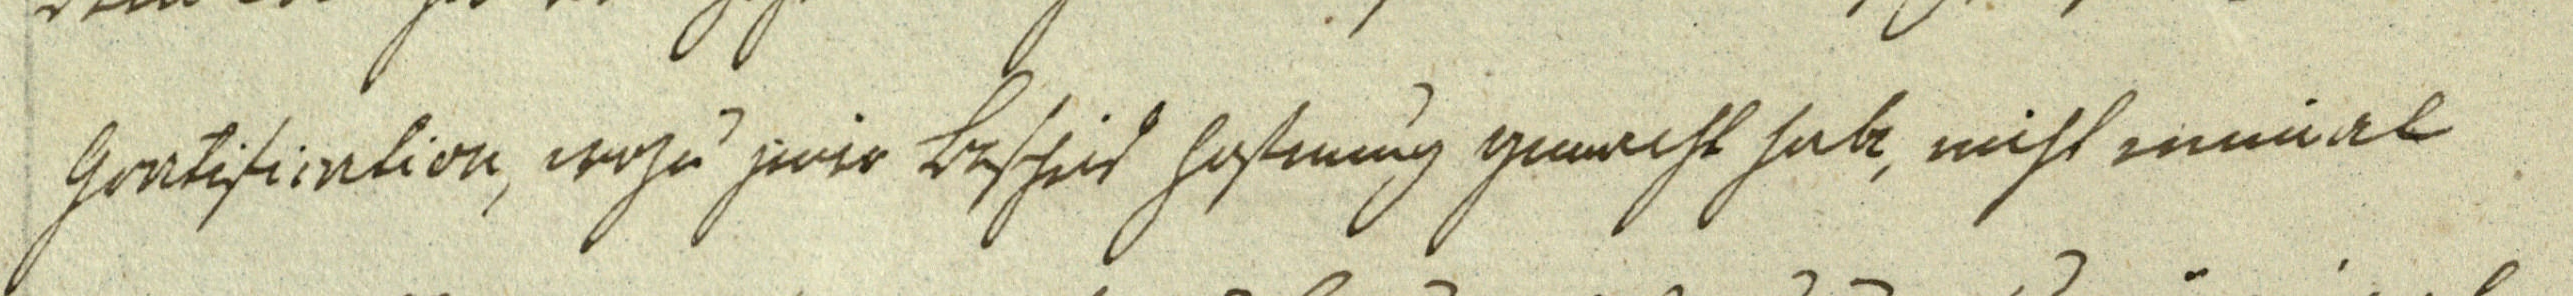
Gratification, wozu jenir Bescheid Hofnung gemacht habe, nicht einmal
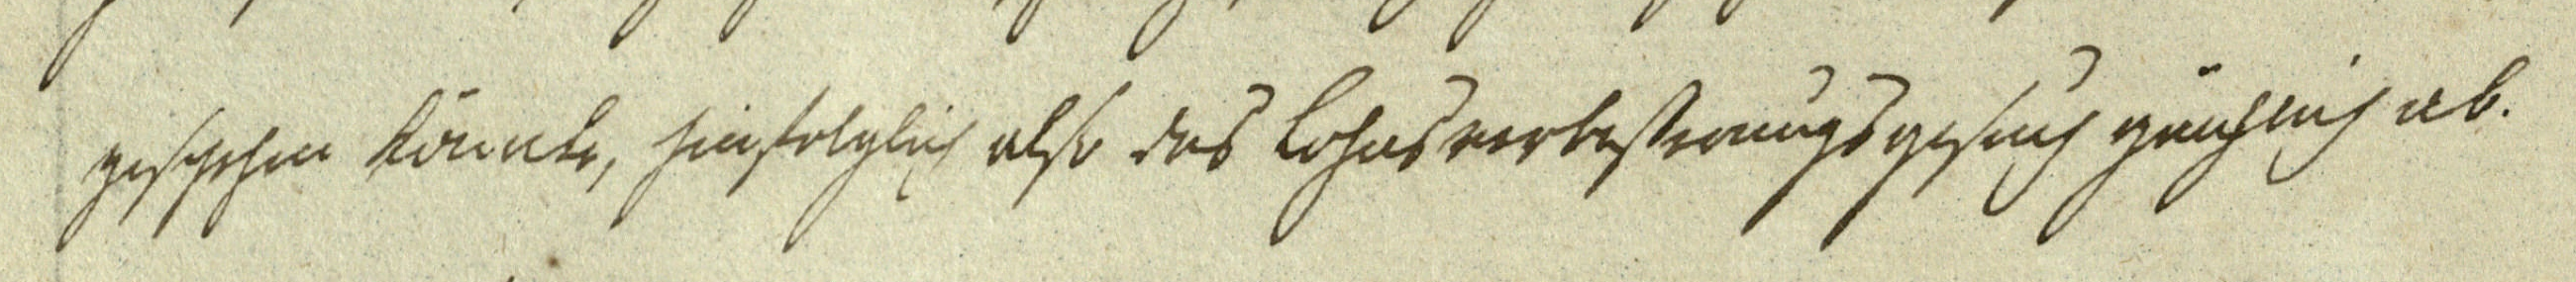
geschehen könnte, hinfolglich also das Lohnsverbesserungsgesuch gänzlich ab¬
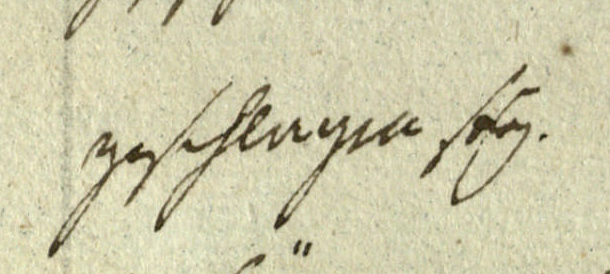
geschlagen seÿ.
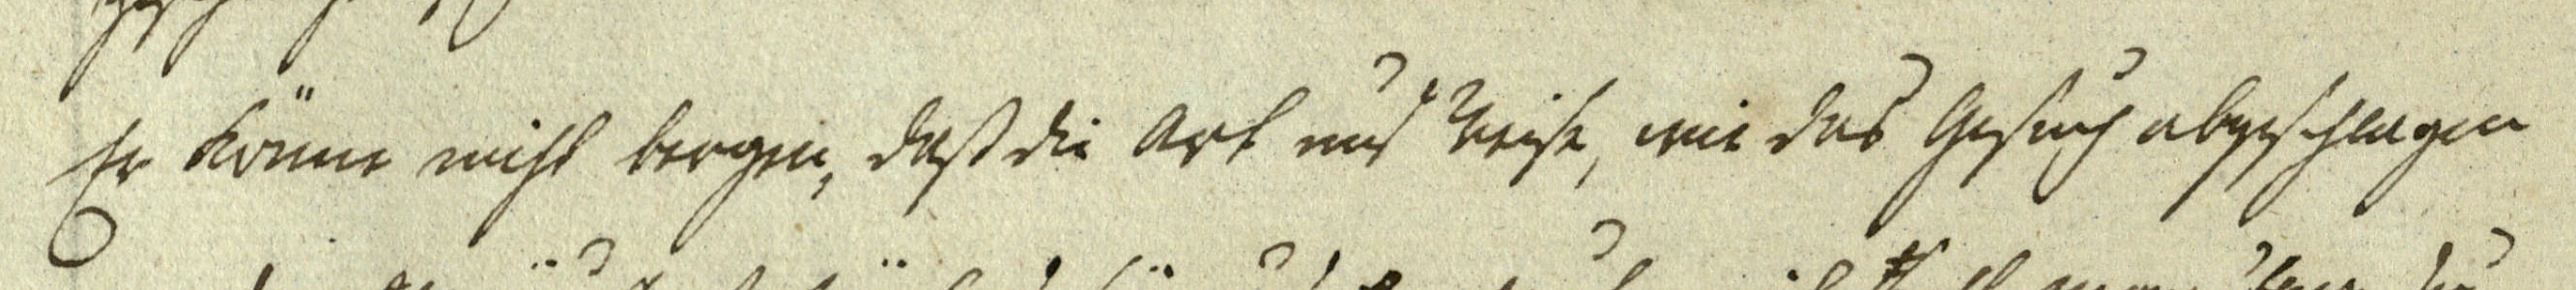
Er könne nicht bergen, daß die Art und Weise, wie das Gesuch abgeschlagen
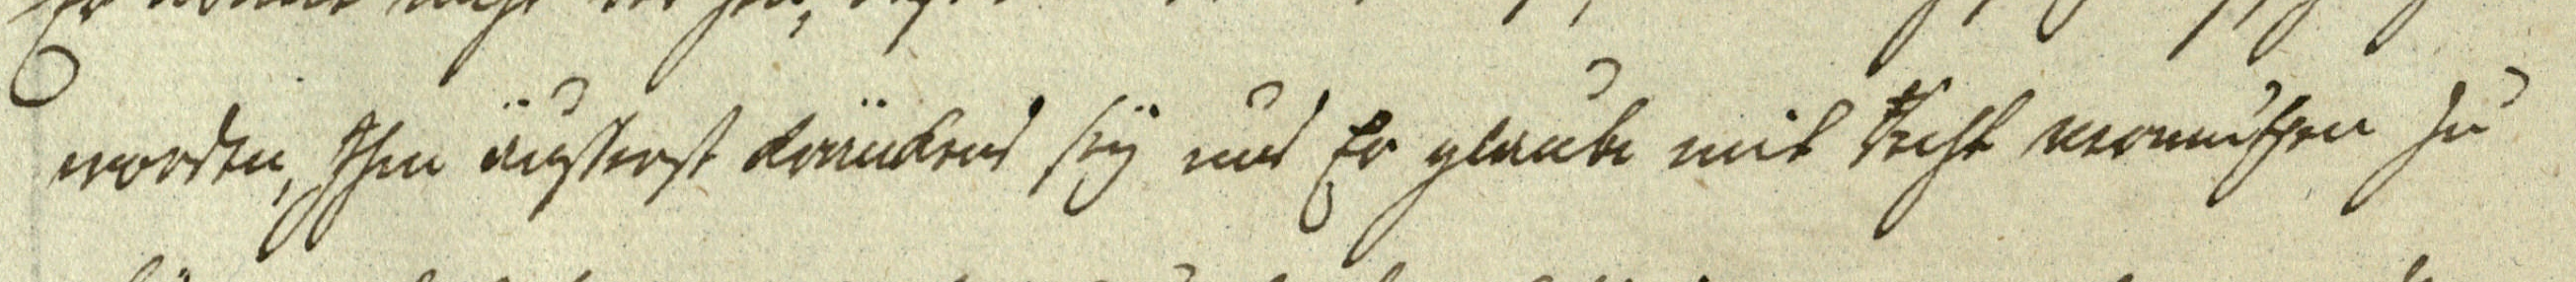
worden, Ihm äusserst kränkend seÿ und Er glaube mit Recht vermuthen zu
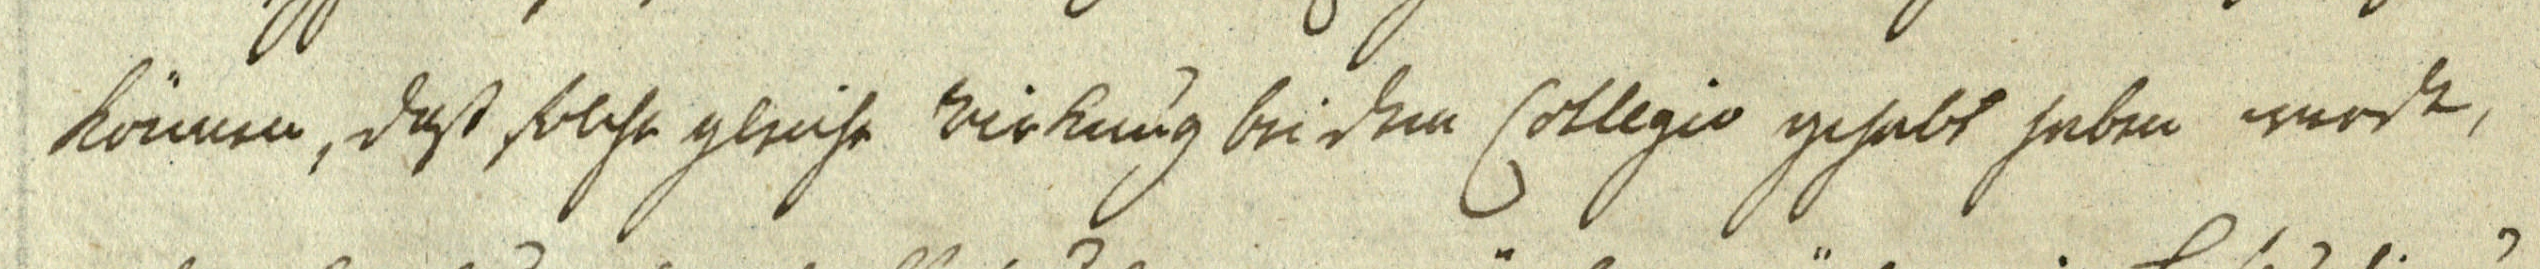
können, daß solche gleiche Wirkung bei dem Collegio gehabt haben werde,
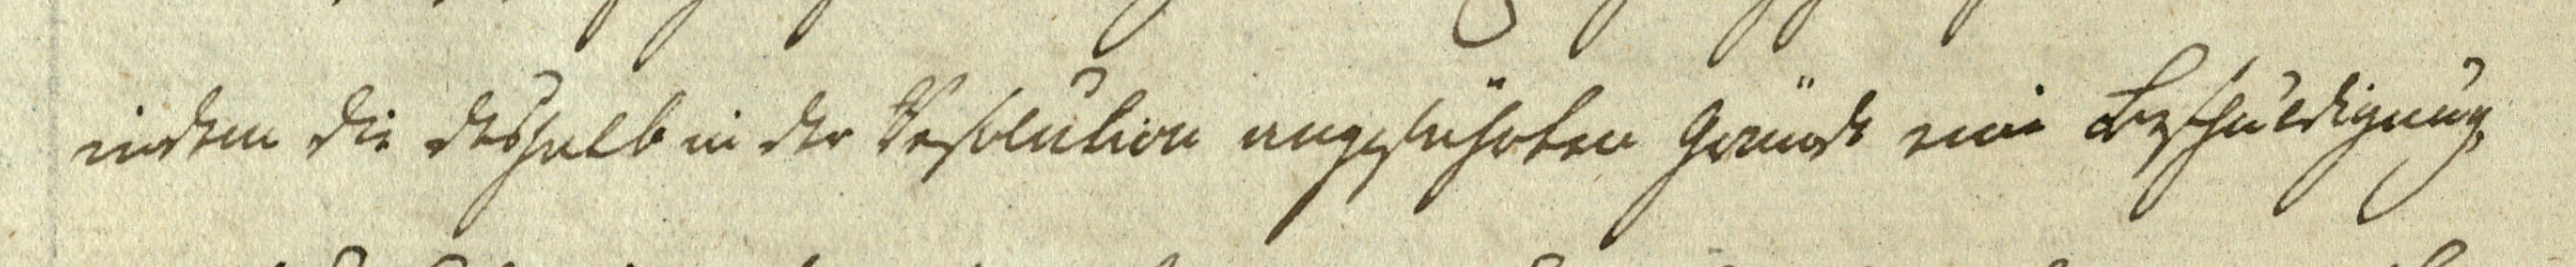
indem die deshalb in der Resolution angeführten Gründe eine Beschuldigung,
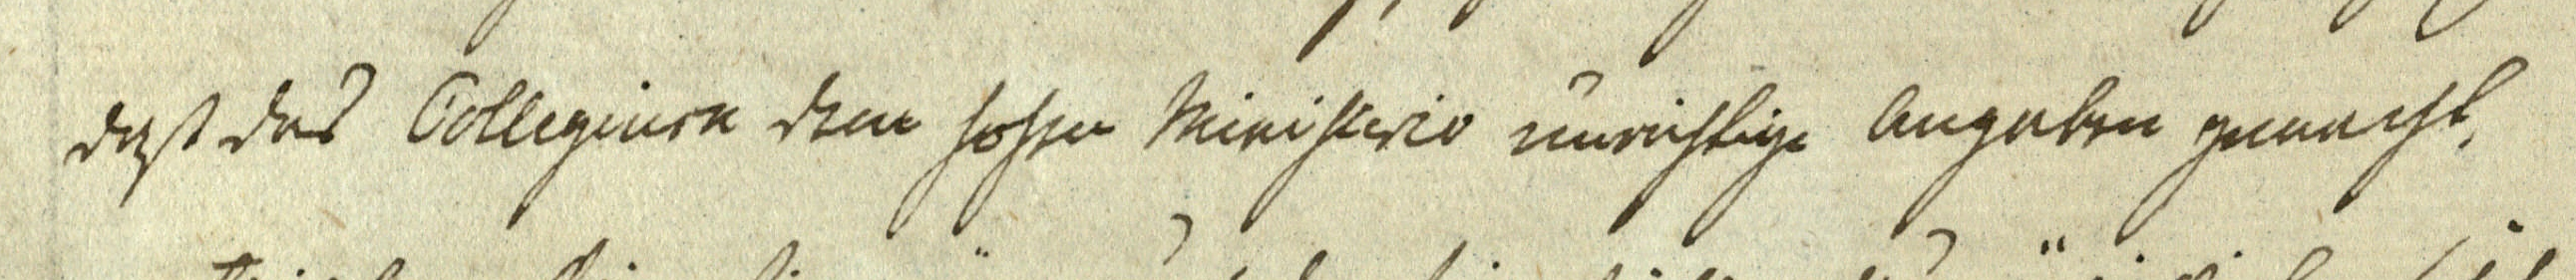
daß das Collegium dem hohen Ministerio unrichtige Angaben gemacht,
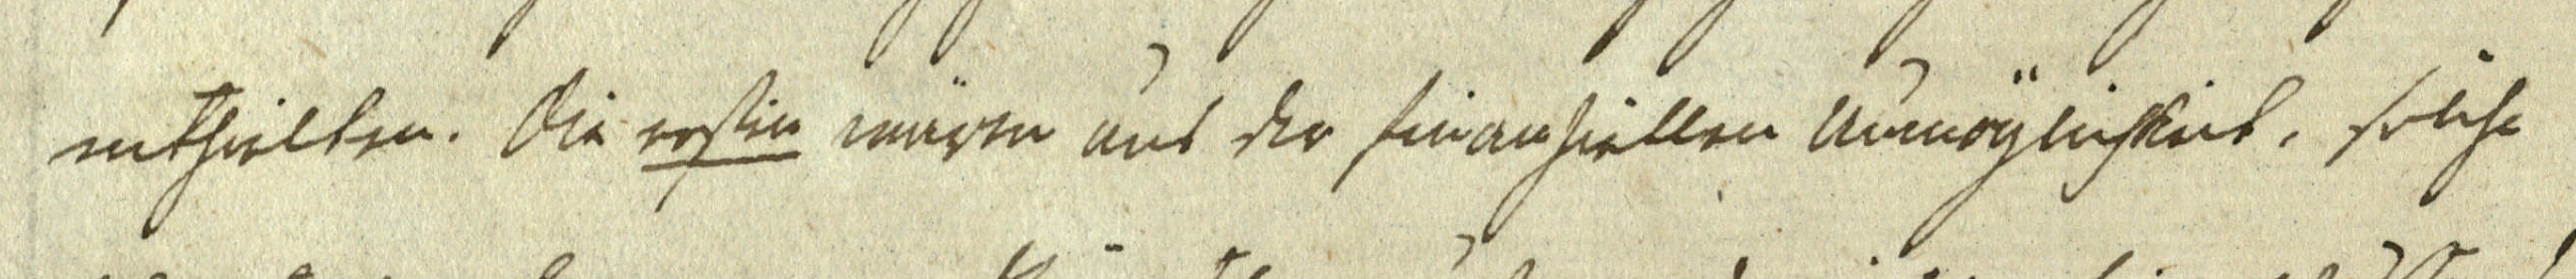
enthielten. Die ersten wären aus der finanziellen Unmöglichkeit, solche
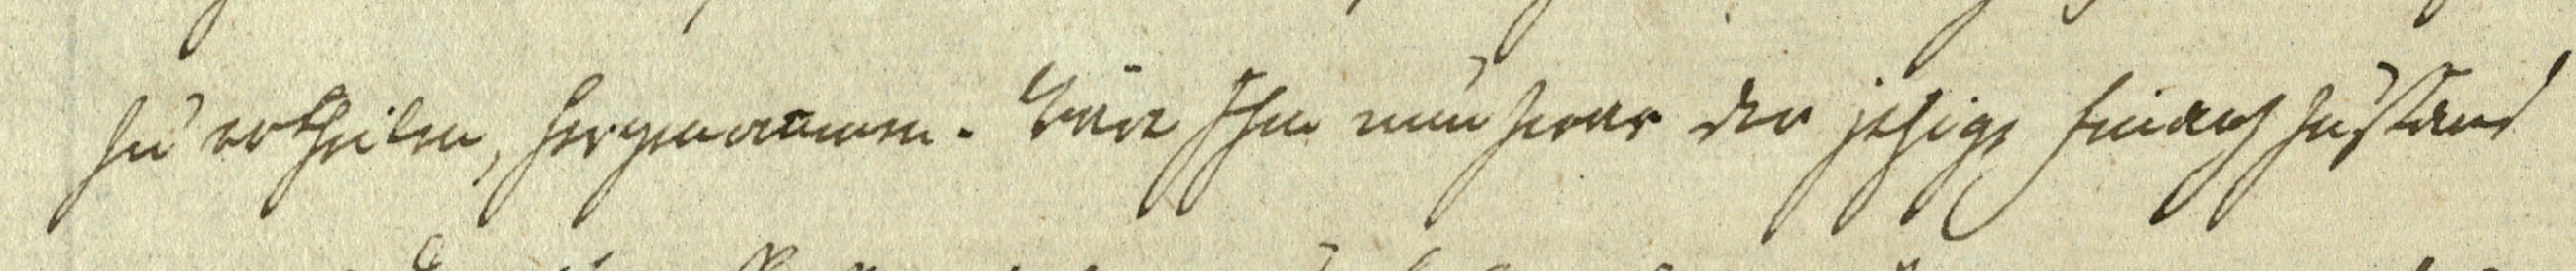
zu ertheilen, hergenommen. Wäre Ihm nun zwar der jetzige Finanzzustand
